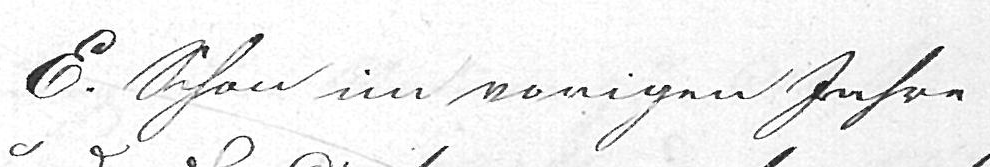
E. Schon im vorigen Jahre
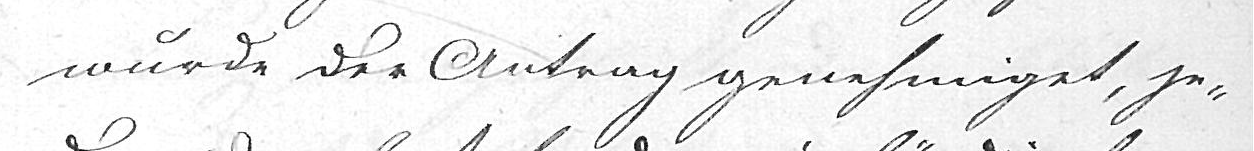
wurde der Antrag genehmiget, je-
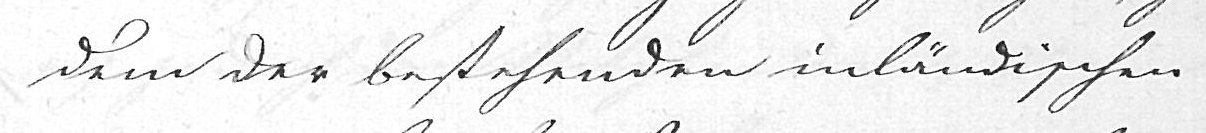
dem der bestehenden inländischen
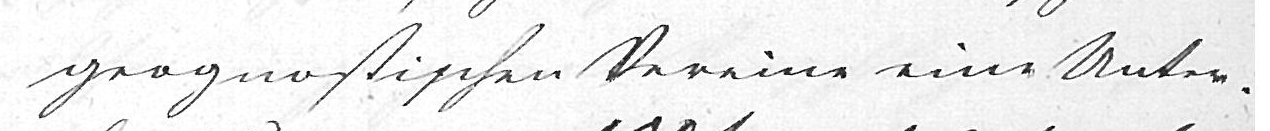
geognostischen Vereine eine Unter-
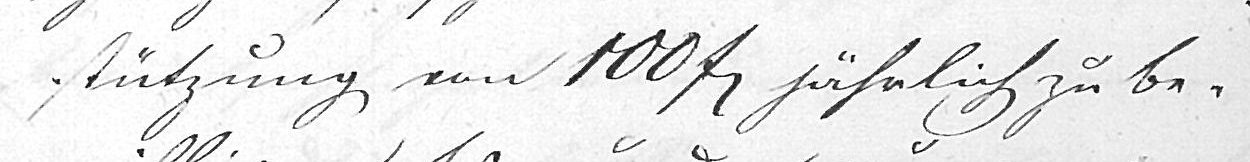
stützung von 100 fl. jährlich zu be-
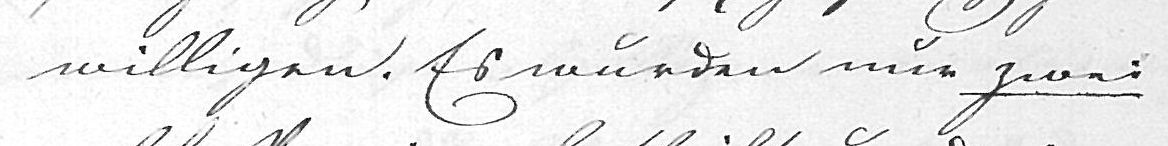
willigen. Es wurden nur zwei
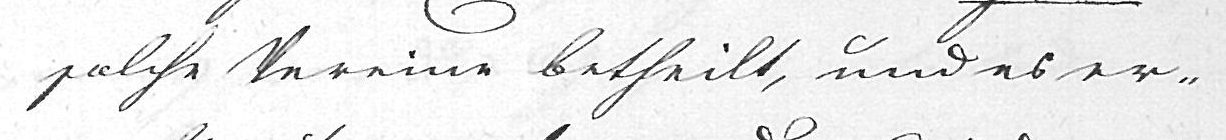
solche Vereine betheilt, und es er-
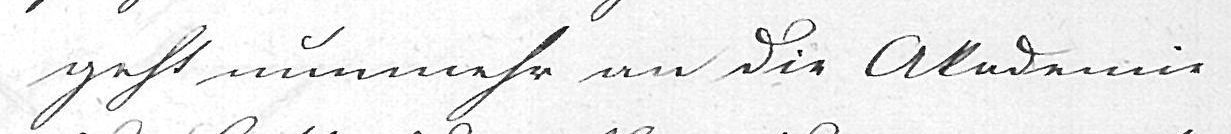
geht nunmehr an die Akademie
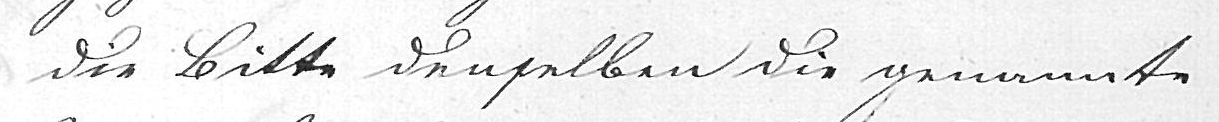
die Bitte denselben die genannte
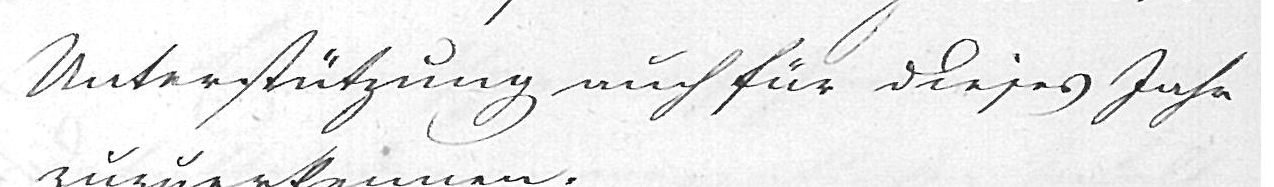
Unterstützung auch für dieses Jahr
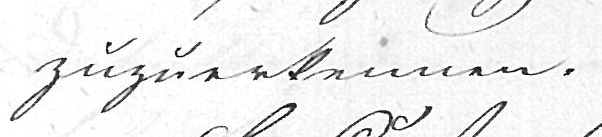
zuzuerkennen.
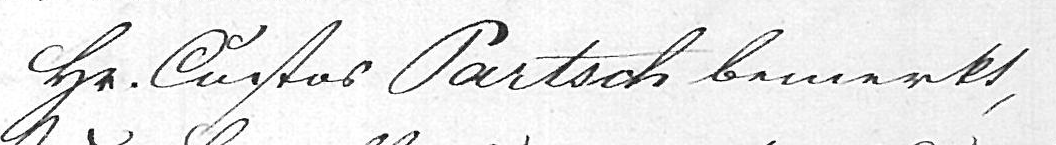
Hr. Custos Partsch bemerkt,
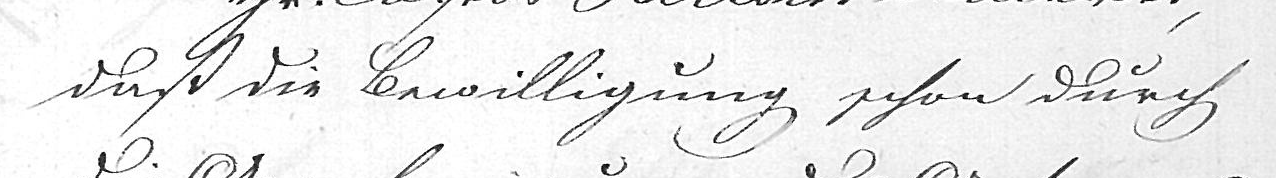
daß die Bewilligung schon durch
